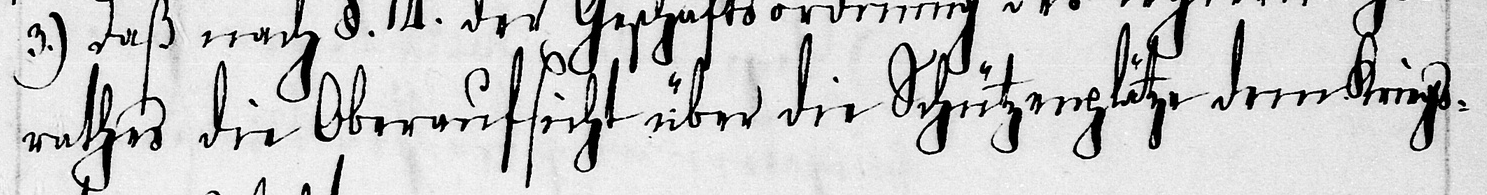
rathes die Oberaufsicht über die Schützenplätze dem Kriegs¬
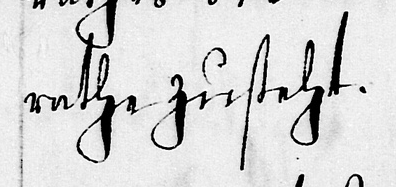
rathe zusteht.
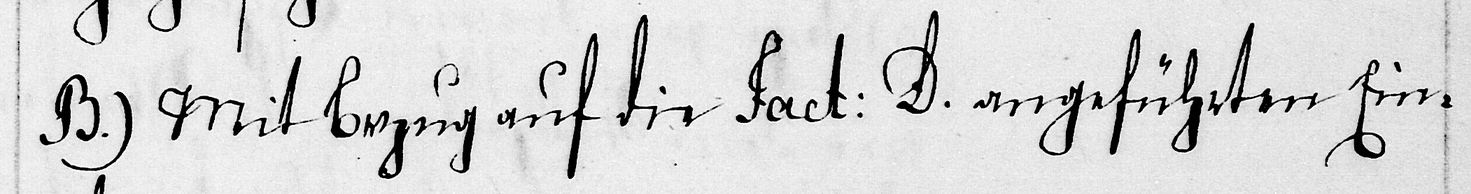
B.) Mit Bezug auf die Fact: D. angeführten Ein¬
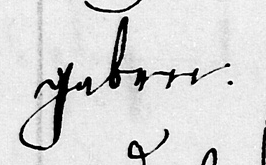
gaben.
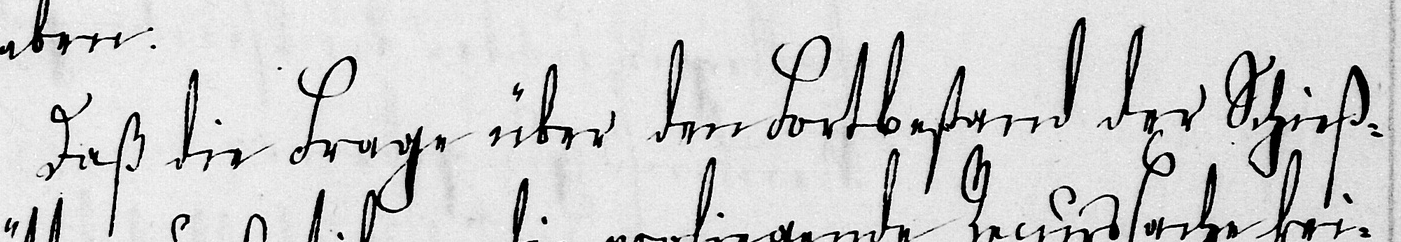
Daß die Frage über den Fortbestand der Schieß¬
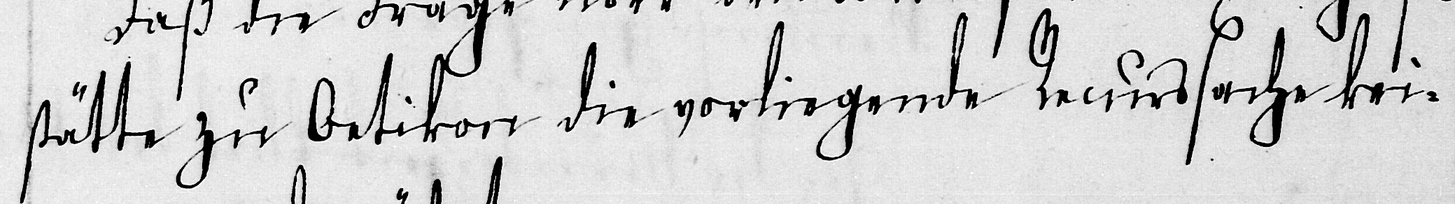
stätte zu Oetikon die vorliegende Recurssache ke¬
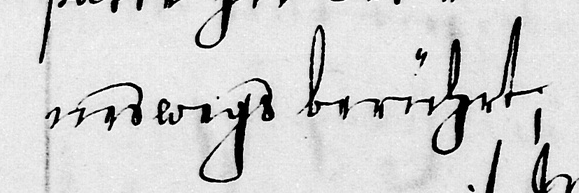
ineswegs berührt;
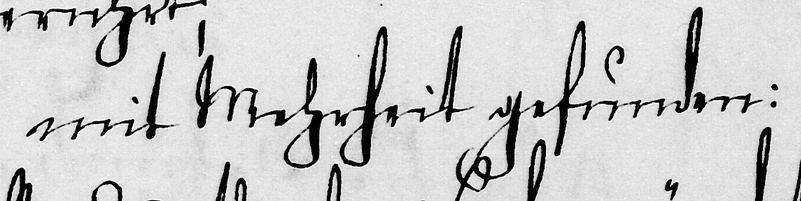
mit Mehrheit gefunden:
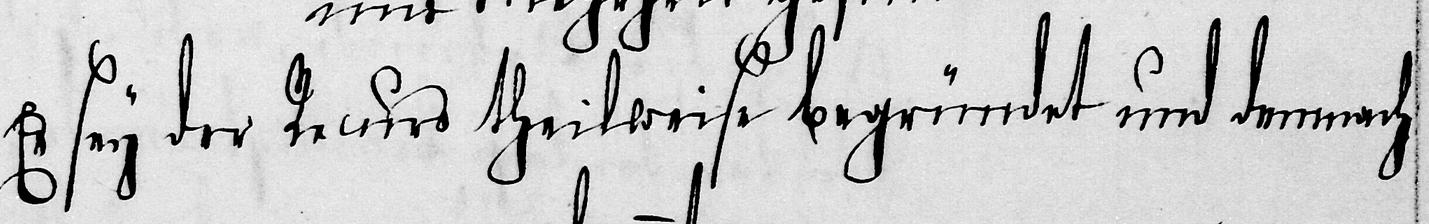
sey der Recurs theilweise begründet und demnach
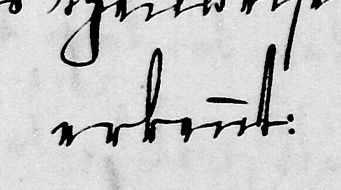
erkennt:
